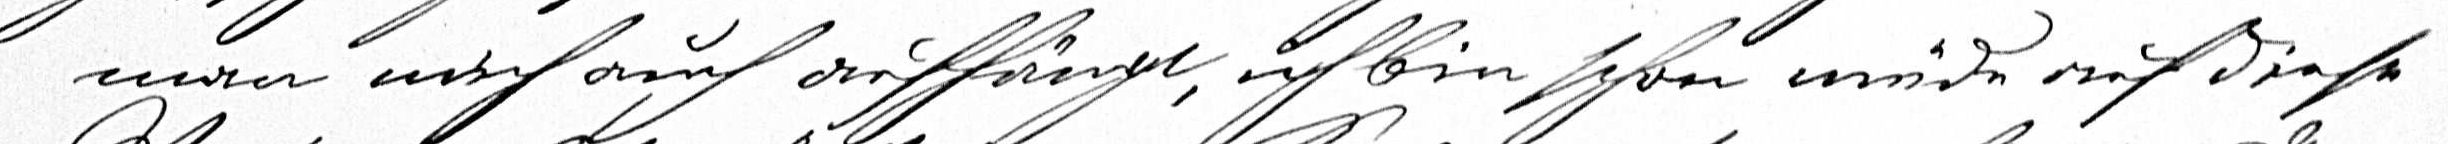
man mich auch aufhängt, ich bin schon müde auf diese
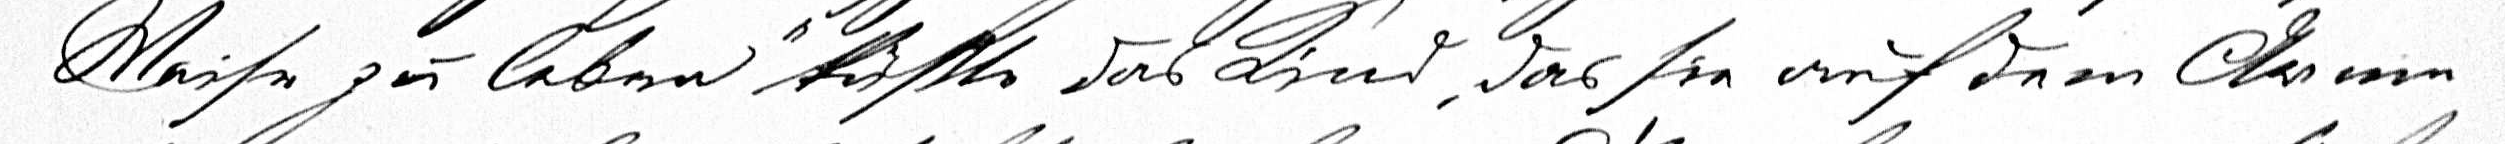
Weise zu leben“ küßte das Kind, das sie auf dem Arme
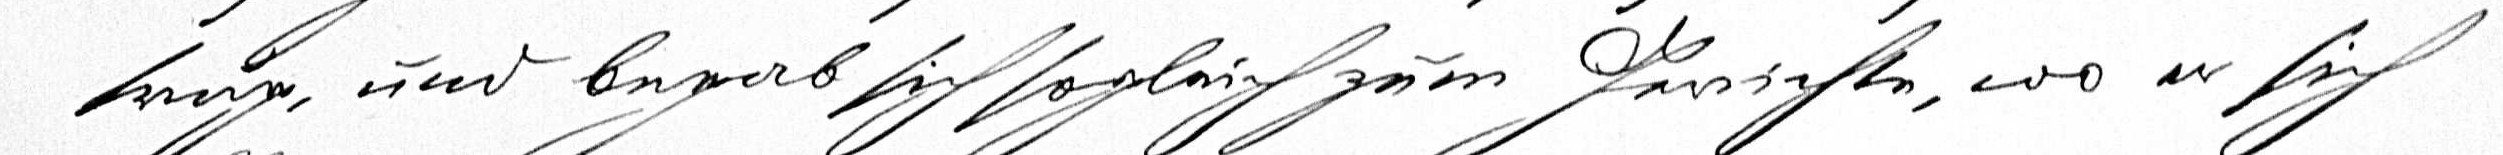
trug, und begab sich sogleich zum Gerichte, wo er sich
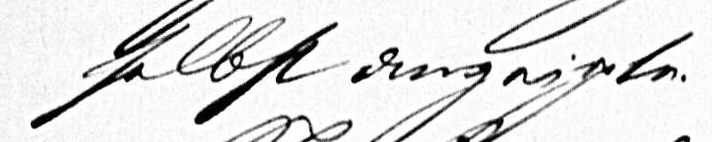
selbst anzeigte.
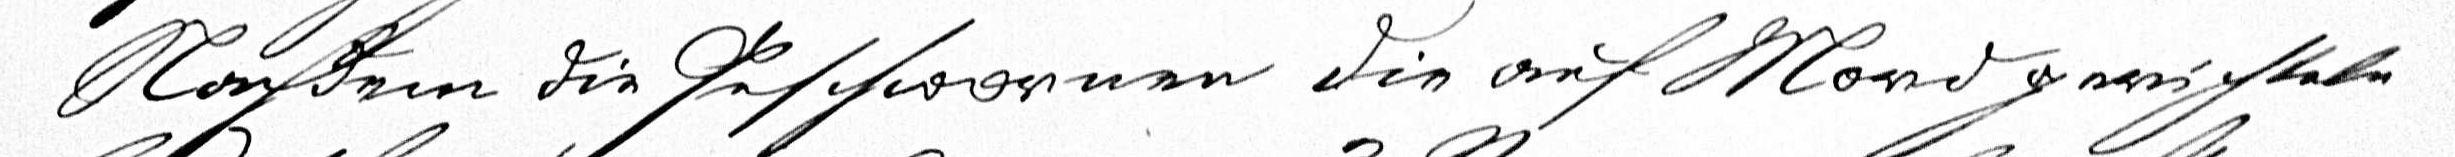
Nachdem die Geschworene die auf Mord gerichtete
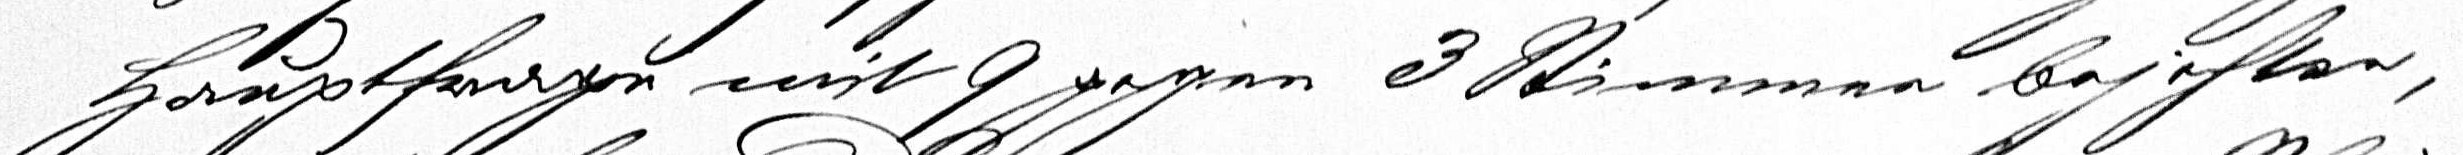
Hauptfrage mit 9 gegen 3 Stimmen bejahten,
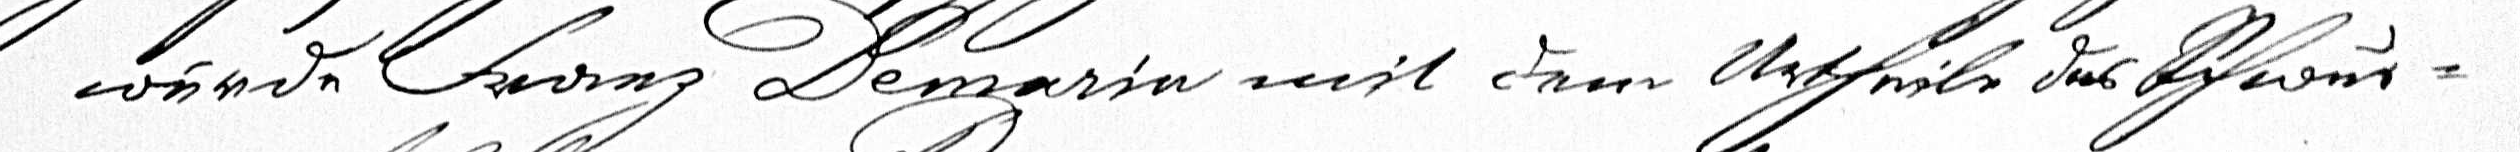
wurde Franz Demarin mit dem Urtheile des Schwur¬
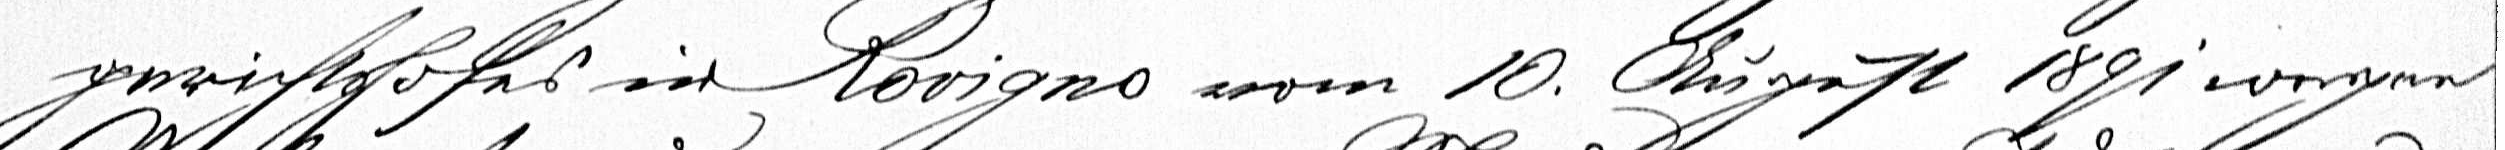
gerichtshofes in Rovigno vom 10. August 1891 wegen
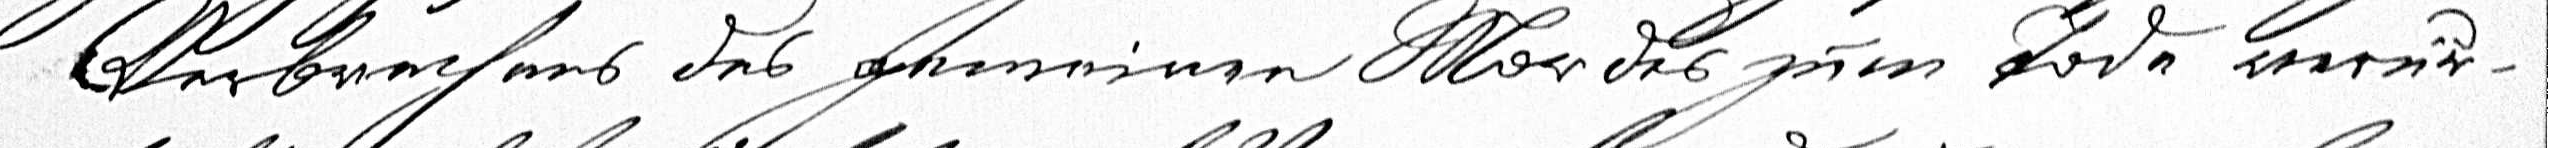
Verbrechens des gemeinen Mordes zum Tode verur¬
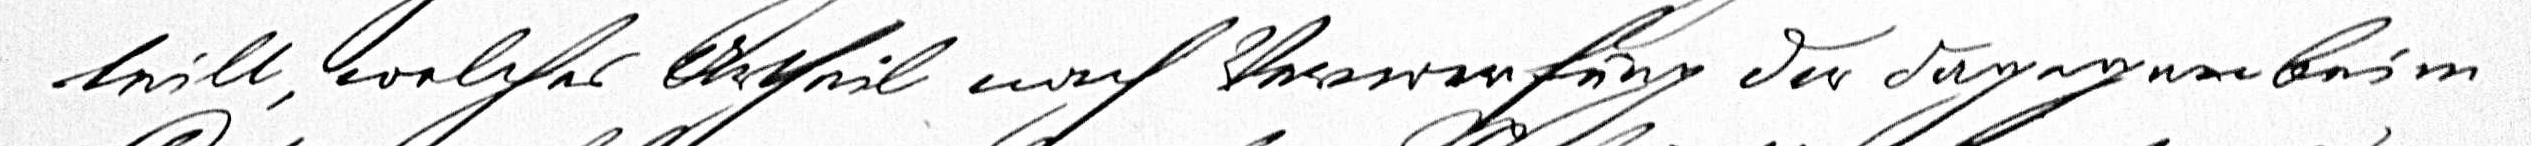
teilt, welches Urtheil noch Verwerfung der dagegen beim
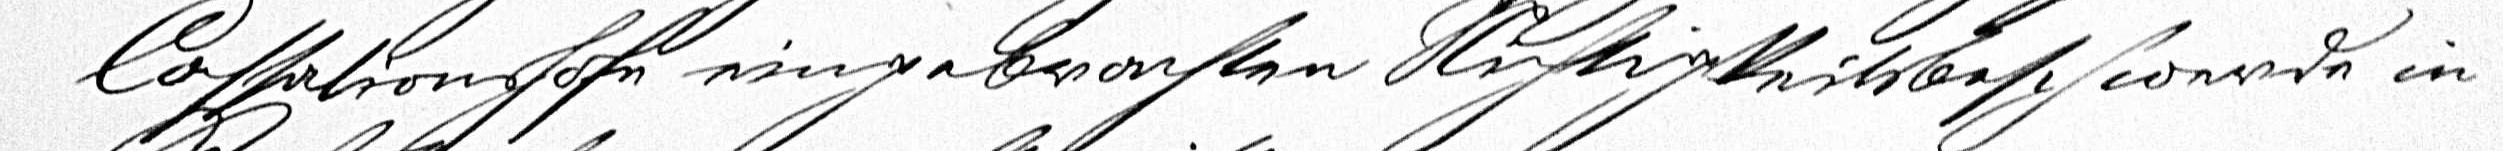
Cassationshofe eingebrachten Nichtigkeitsbeschwerde in
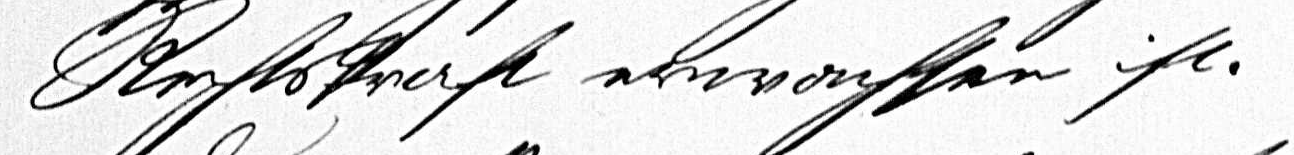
Rechtskraft erwachsen ist.
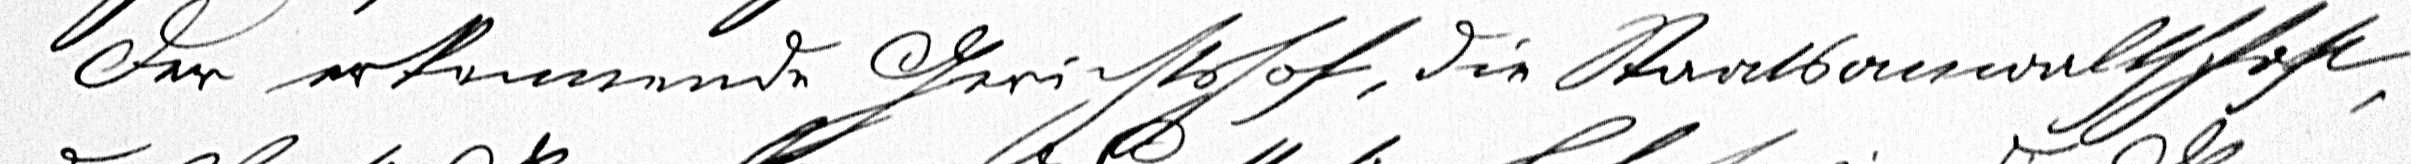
Der erkennende Gerichtshof, die Staatsanwaltschaft
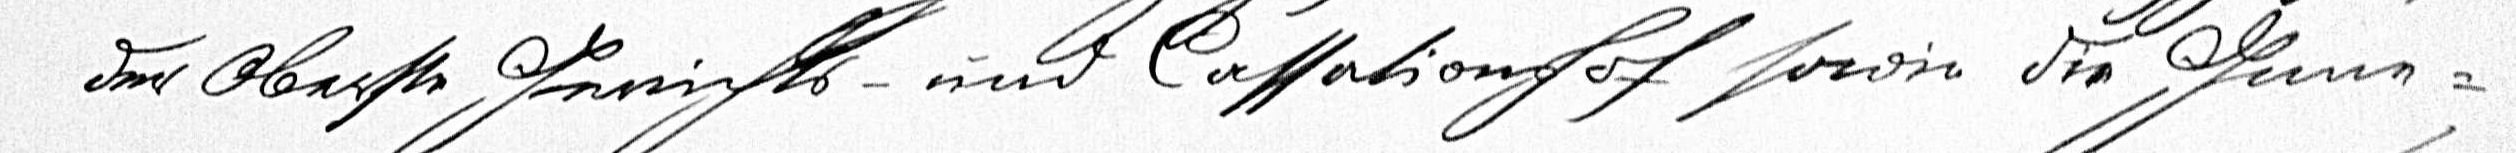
der Oberste Gerichts- und Cassationshof sowie die Gene¬
